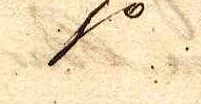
1o
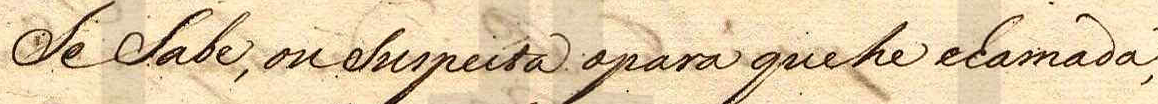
Se Sabe, ou Suspeita o para que he chamada,
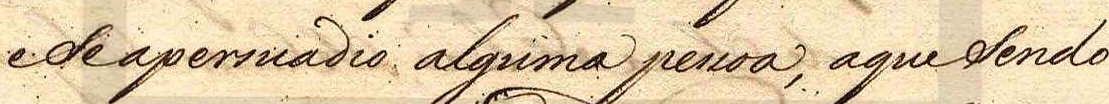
e Se a persuadio alguma pessoa, a que Sendo
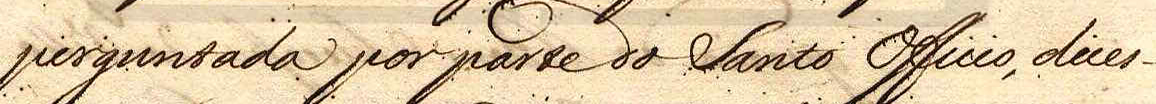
perguntada por parte do Santo Officio, dices
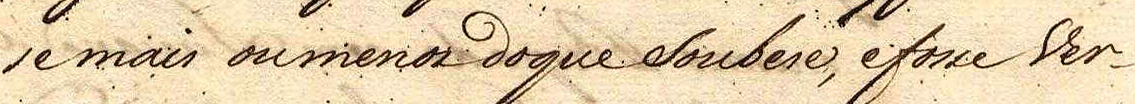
se mais ou menos do que Soubese, e fosse Ver
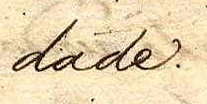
dade.
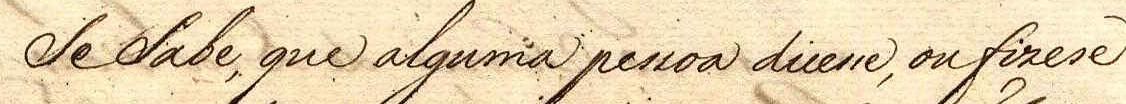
Se Sabe, que alguma pessoa dicesse, ou fizese
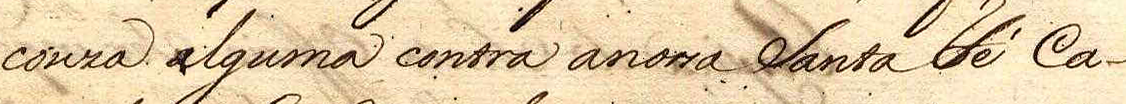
couza alguma contra a nossa Santa Fé Ca
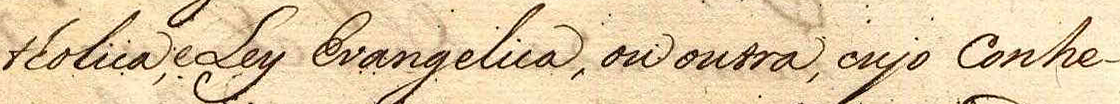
tholica, e Ley Evangelica, ou outra, cujo conhe
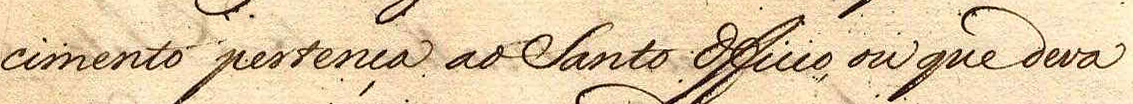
cimento pertença ao Santo Officio, ou que deva
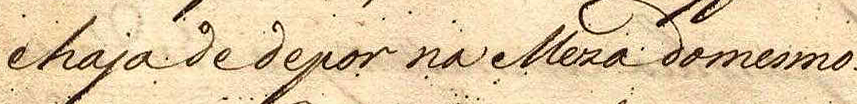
e haja de depor na Meza do mesmo.
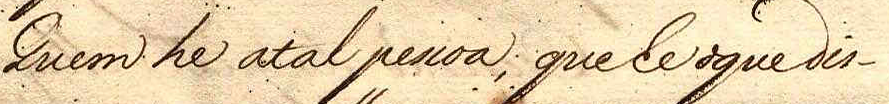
Quem he a tal pessoa, que he o que dis
